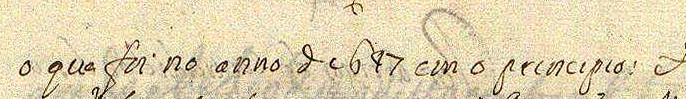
o que foi no anno de 647 em o principio: &
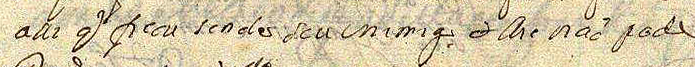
asi q̄ ficou sendo seu inimigo & lhe naõ pode
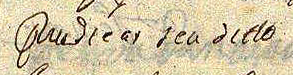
p̄iudicar seu ditto
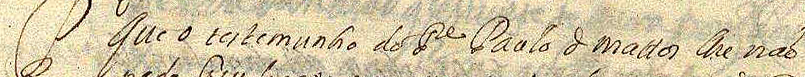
P que o testemunho do Pe Paulo d mattos lhe naõ
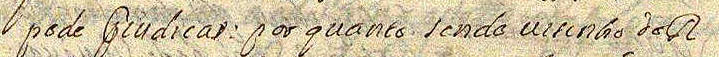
pode p̄iudicar: porquanto sendo uisinho do R
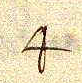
4
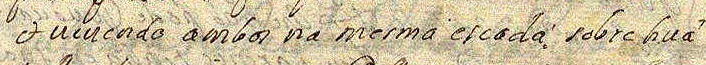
& uiuendo ambos na mesma escada: sobre huā
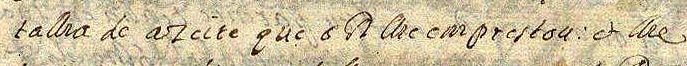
talha de azeite que o R lhe emprestou: & lhe
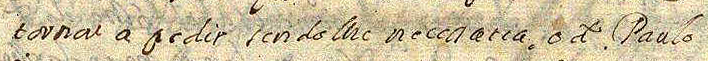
tornou a pedir sendolhe necesaria, o d̄ Paulo
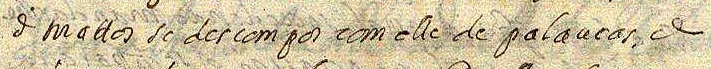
d mattos se descompos com elle de palauras, &
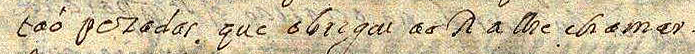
taõ pezadas que obrigou ao R a lhe chamar
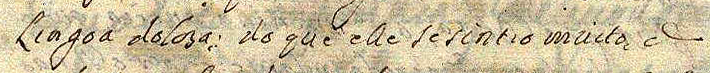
lingoa doloza: do que elle se sintio muito, &
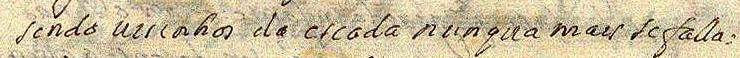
sendo uisinhos da escada nunqua mais se falla
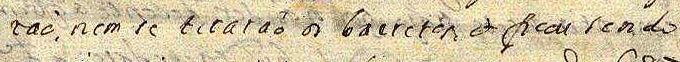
raõ, nem se tiraraõ os barretes, & ficou sendo
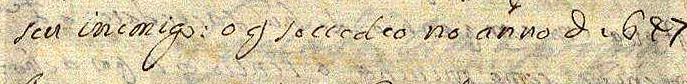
seu inemigo: o q̄ soccedeo no anno de 1647
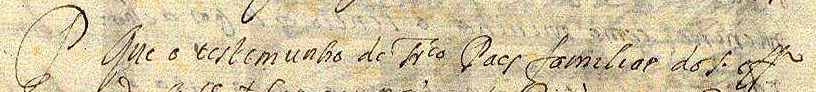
P que o testemunho de Frco Paes familiar do s. offo
